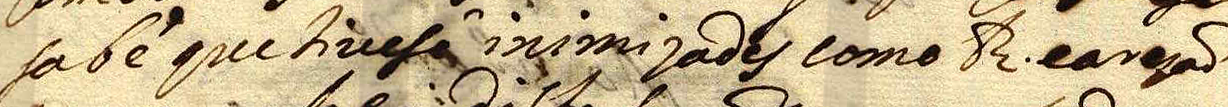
sabe que tiuesē inimizades com o R. e a rezaõ
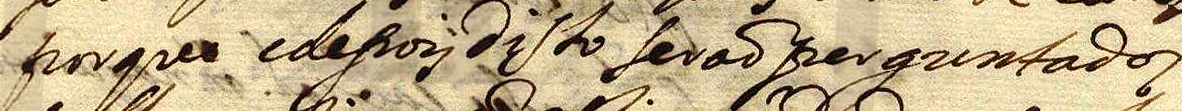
porque e depois disto seraõ perguntados
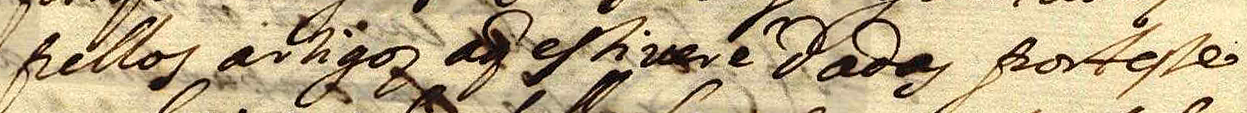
pellos artigos a q̄ estiuerē dadas por teste
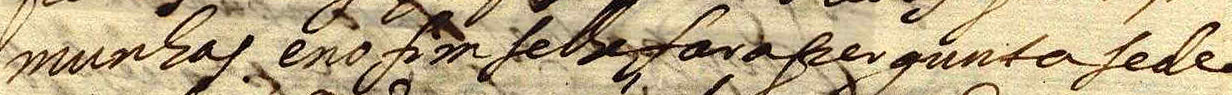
munhas e no fim se lhes fara pergunta se de
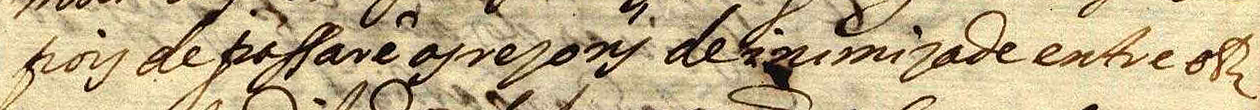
pois de passarē as rezon̄s de inimizade entre o R
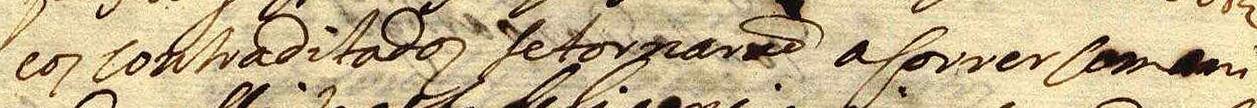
e os contraditados se tornaraõ a Correr Com ami
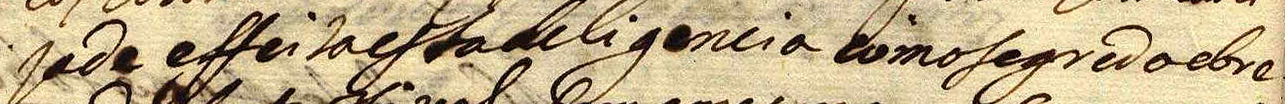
zade e ffeita esta deligencia com o segredo e bre
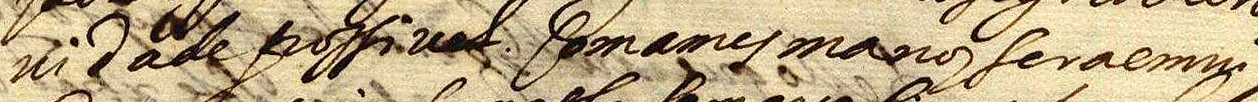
uidade possiuel. Com a mesma nos sera emui
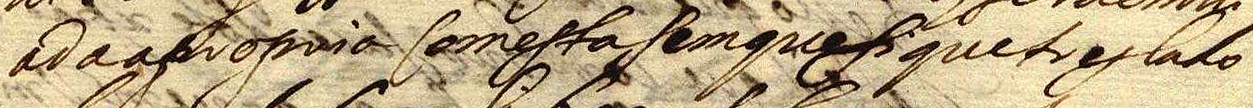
ada a propria Com esta sem que fique treslado
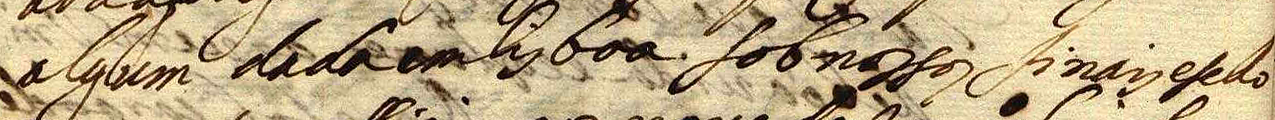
algum dada em lisboa sob nossos sinais e sello
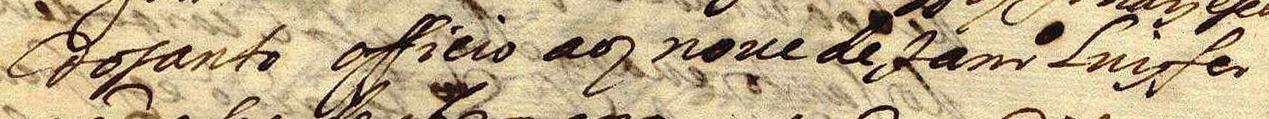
do santo officio aos noue de Janro Luis fer
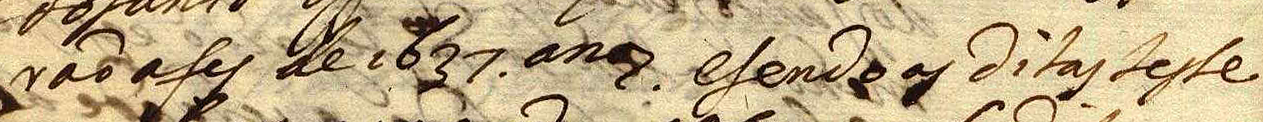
raõ a fes de 1637. anos. e sendo as ditas teste
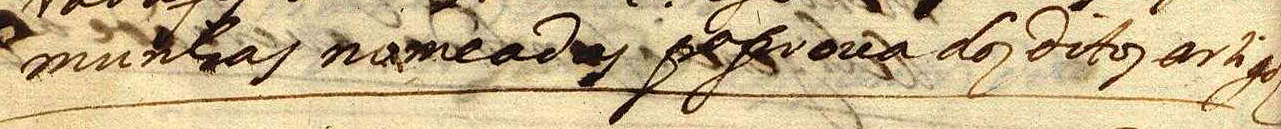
munhas nomeadas pa proua dos ditos artigos
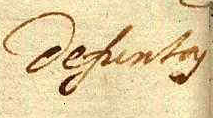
defuntas
